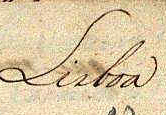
Lisboa
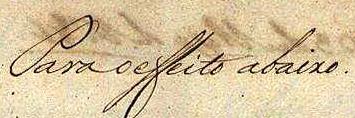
Para o effeito abaixo.
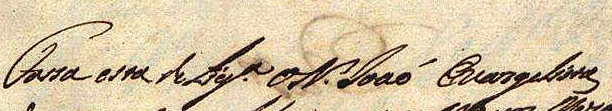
Para esta delig.a o N. Ioaõ Evangelista
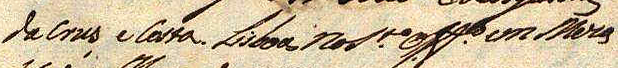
da Crus e Costa. Lisboa no S.to Off.o em Meza
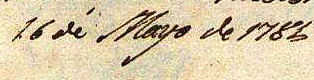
16 de Mayo de 1785
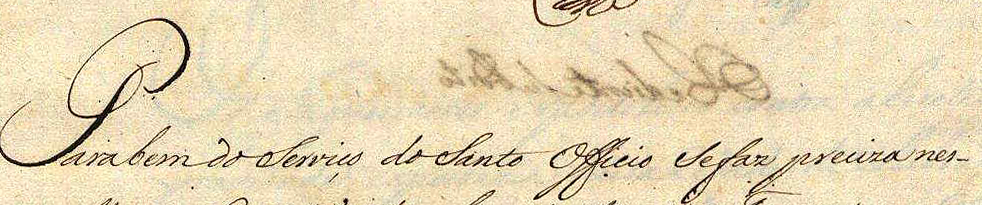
Para bem do Serviço do Santo Officio se faz preciza nes
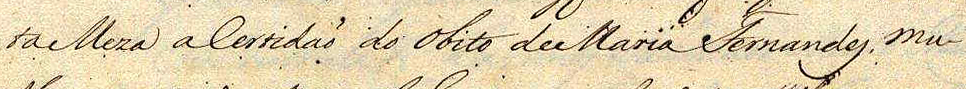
ta Meza a Certidaõ do obito de Maria Fernandes, mu
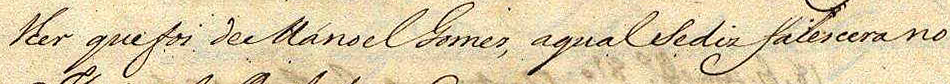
lher, que foi de Manoel Gomes, a qual se diz falescera no
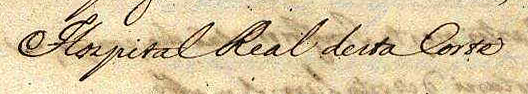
Hospital Real desta Corte
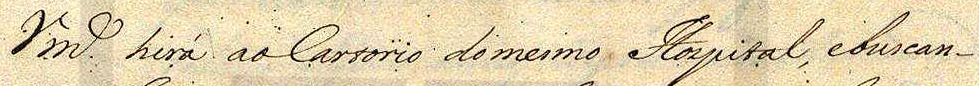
V m.e hirá ao Cartorio do mesmo Hospital, e buscan
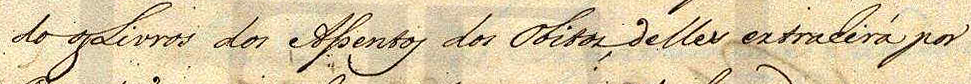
do os Livros dos Assentos dos Obitos, delles extrahirá por
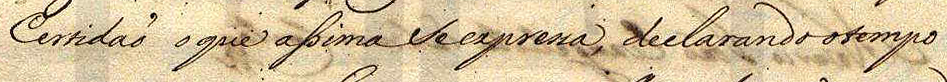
Certidaõ o que assima se expressa, declarando o tempo
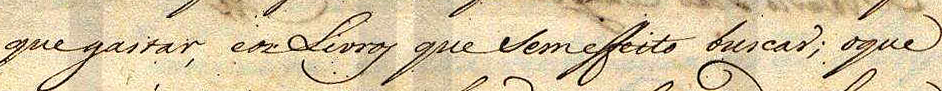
que gastar, e os Livros que sem effeito buscar; o que
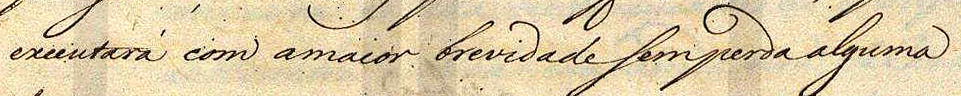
executará com a maior brevidade sem perda alguma
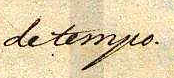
de tempo.
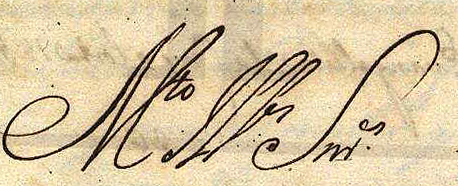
M.to Ill.os Snr.es
